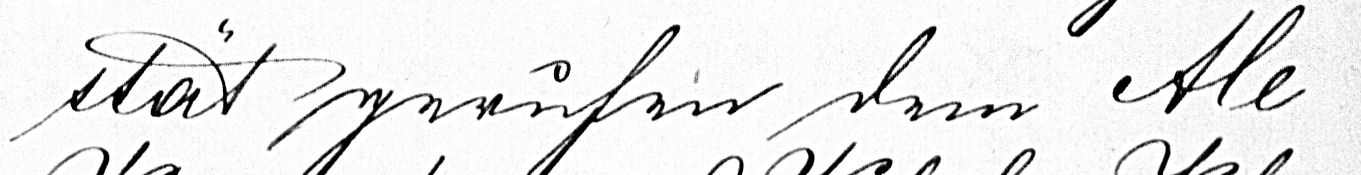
stät gerufen dem Ale
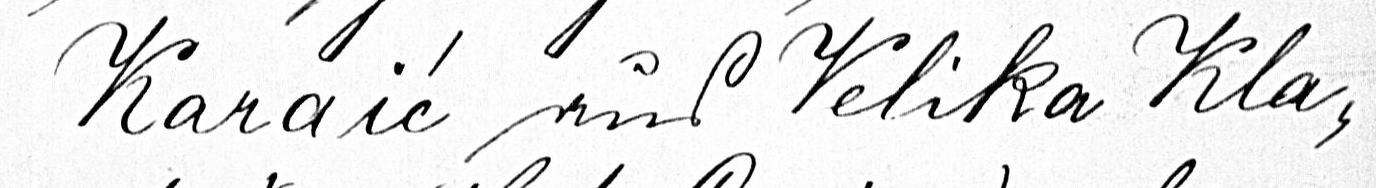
Karaić aus Velika Kla¬
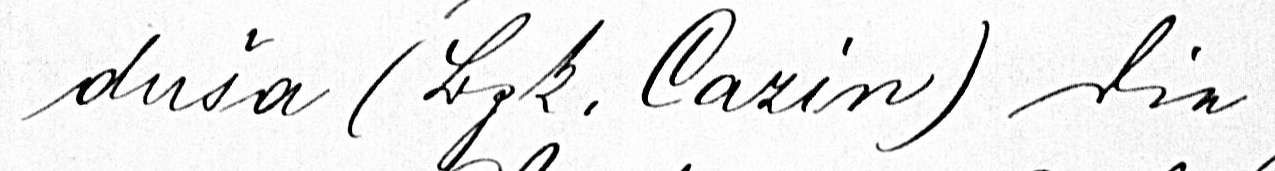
dusa (Bzk. Cazin) die
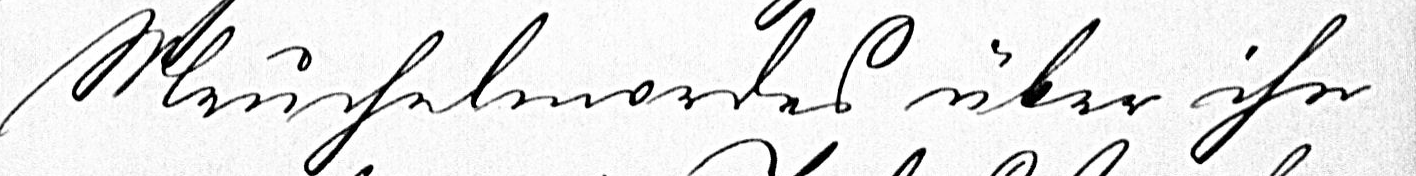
Meuchelmordes über ihr
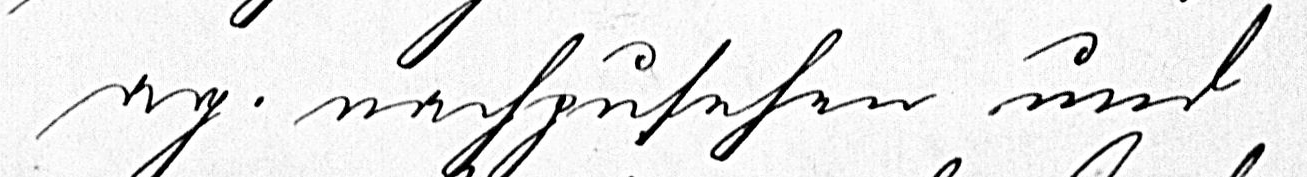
ag. nachzusehen und
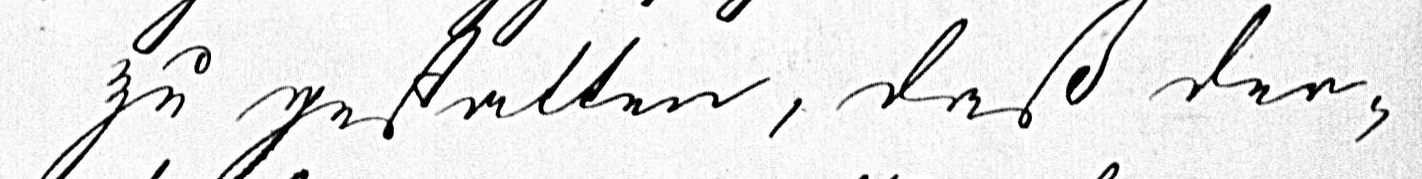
zu gestatten, daß der¬
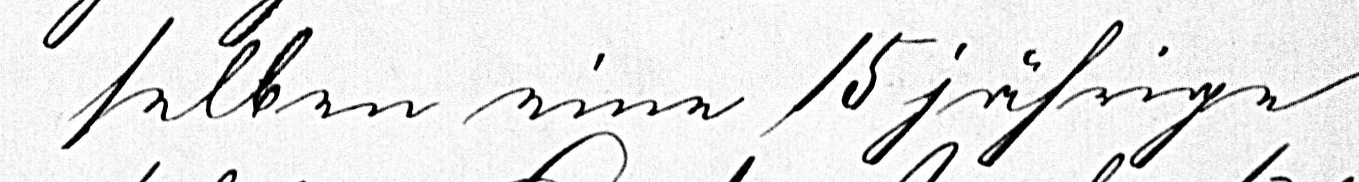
selben eine 15 jährige
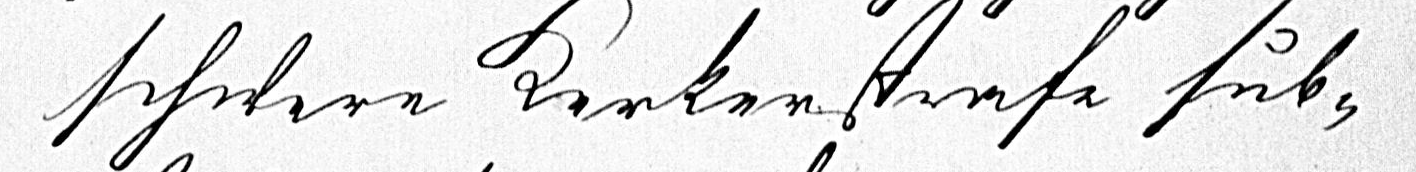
schwere Kerkerstrafe sub¬
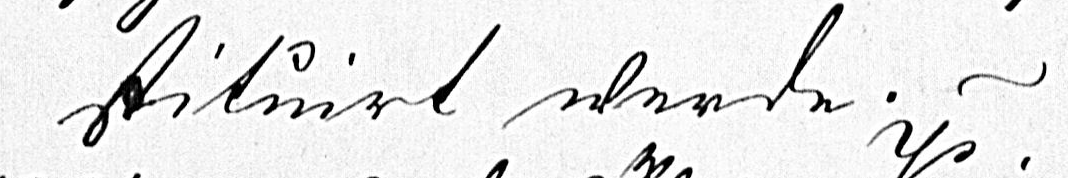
stituiert werde.
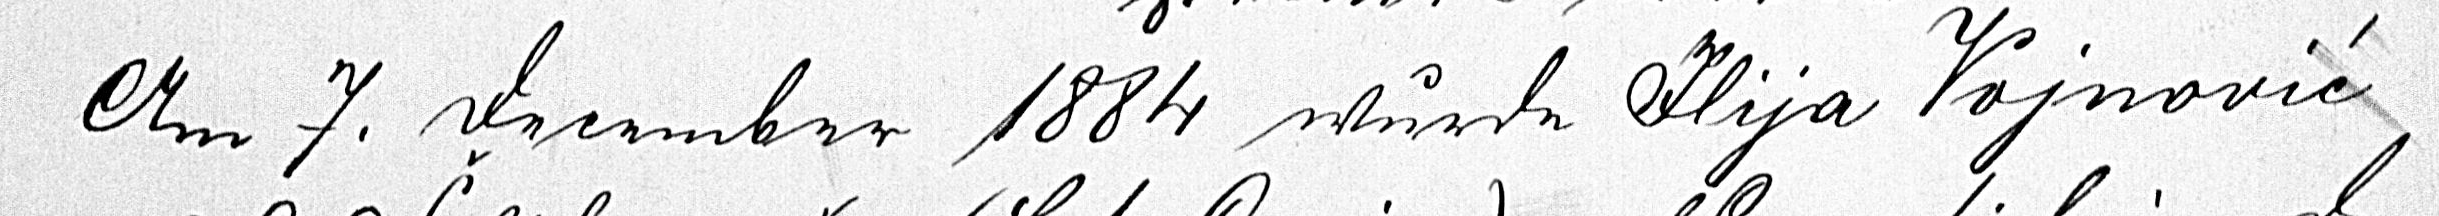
Am 7. December 1884 wurde Ilija Vojnović
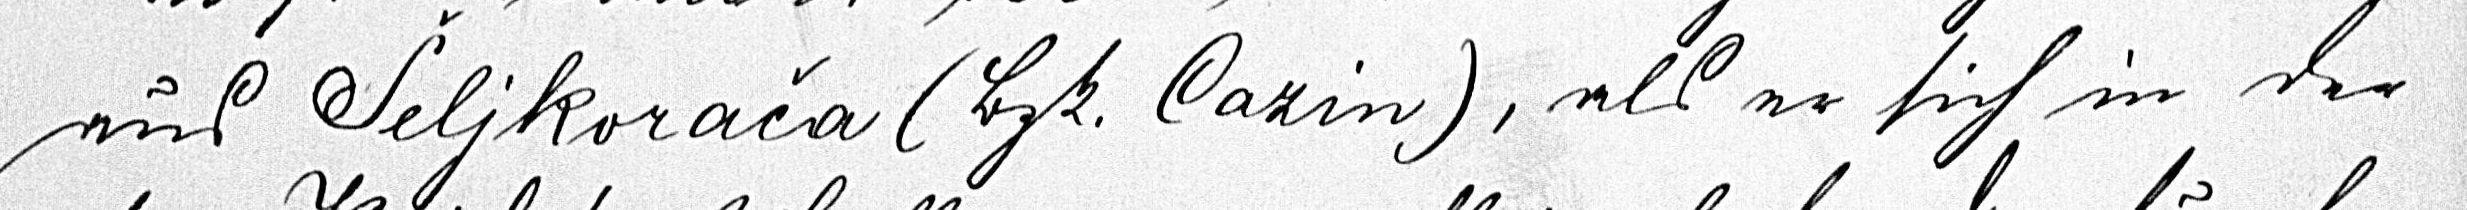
aus Seljkoraca (Bzk. Cazin), als er sich in der
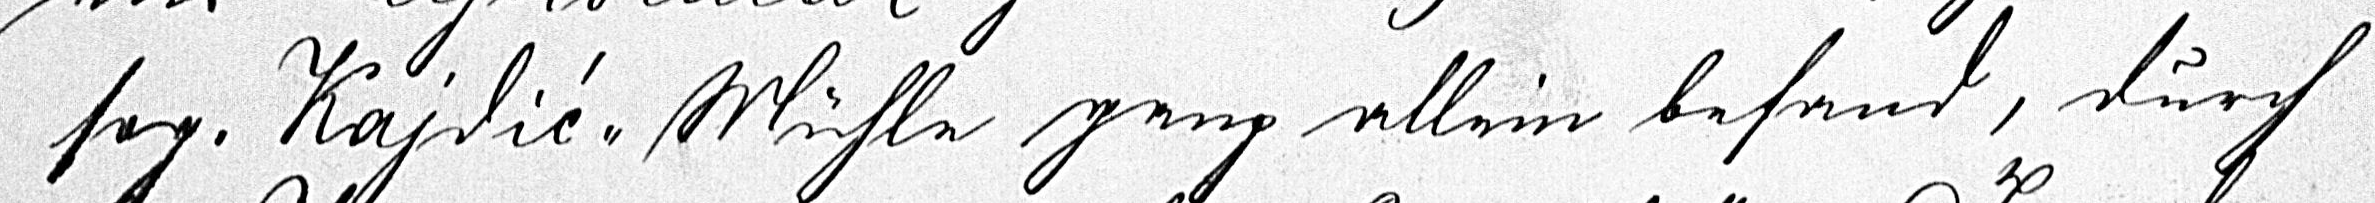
seg. Kajdić Mühle gang allein befand, durch
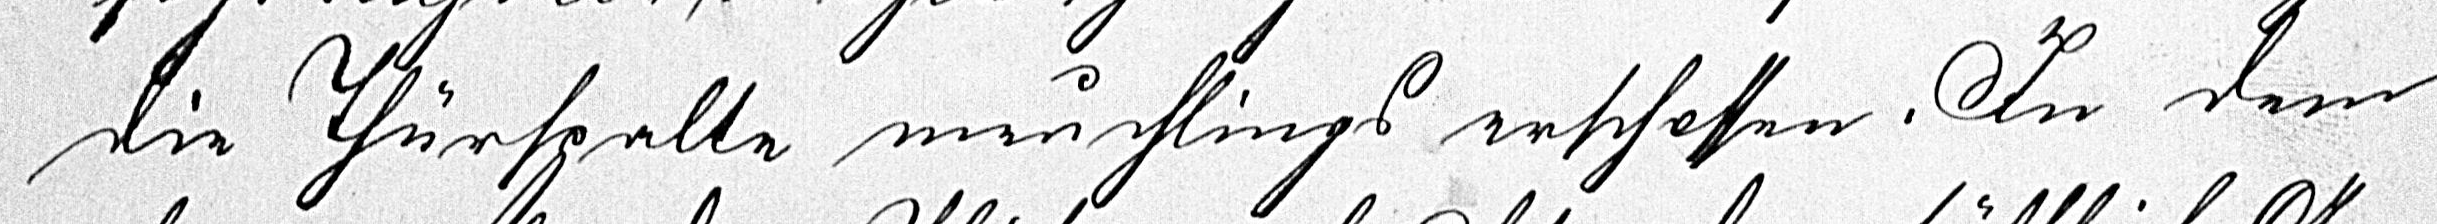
die Thürspalte meuchlings erschossen. In dem
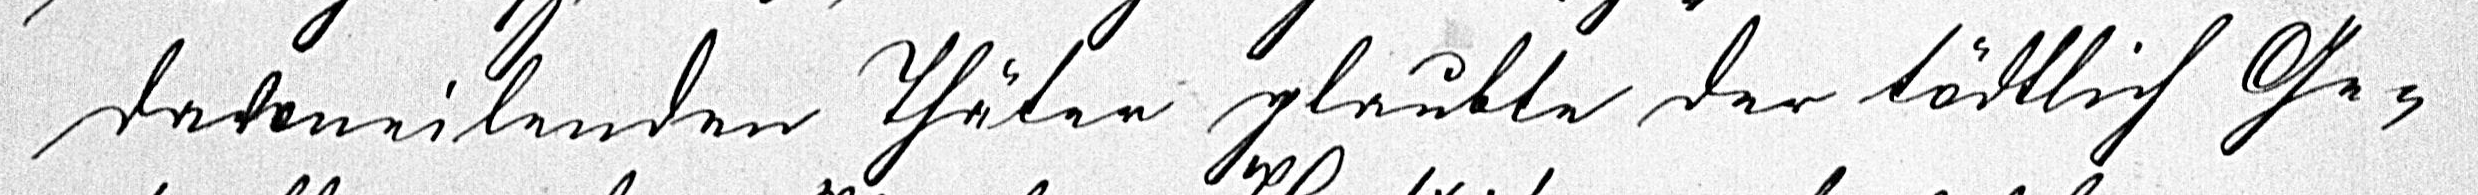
davoneilenden Thüten glaubte der tödtlich Ge¬
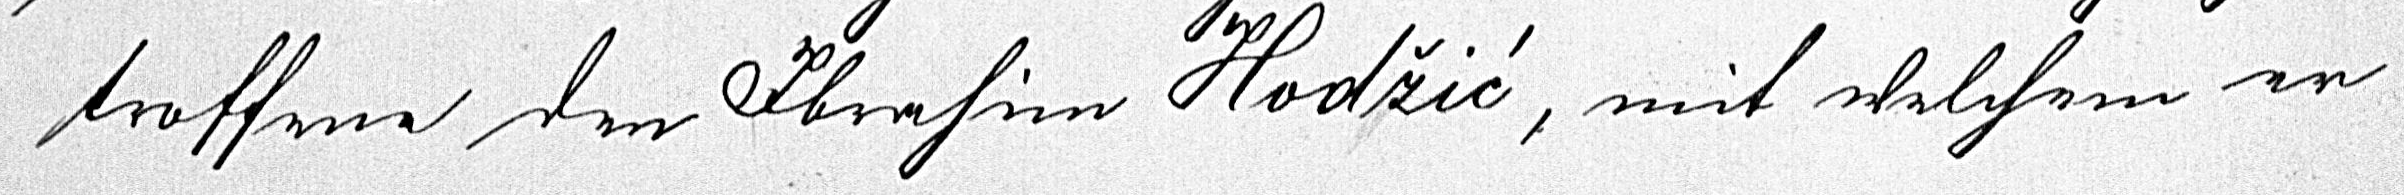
troffene den Ibrasim Hodzić, mit welchem er
